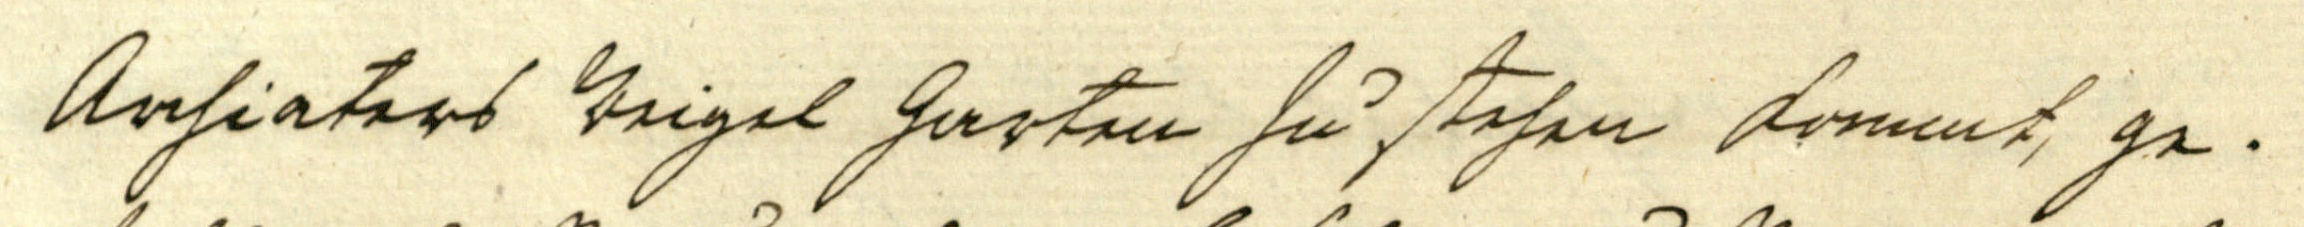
Archiaters Weigel Garten zu stehen kommt, ge¬
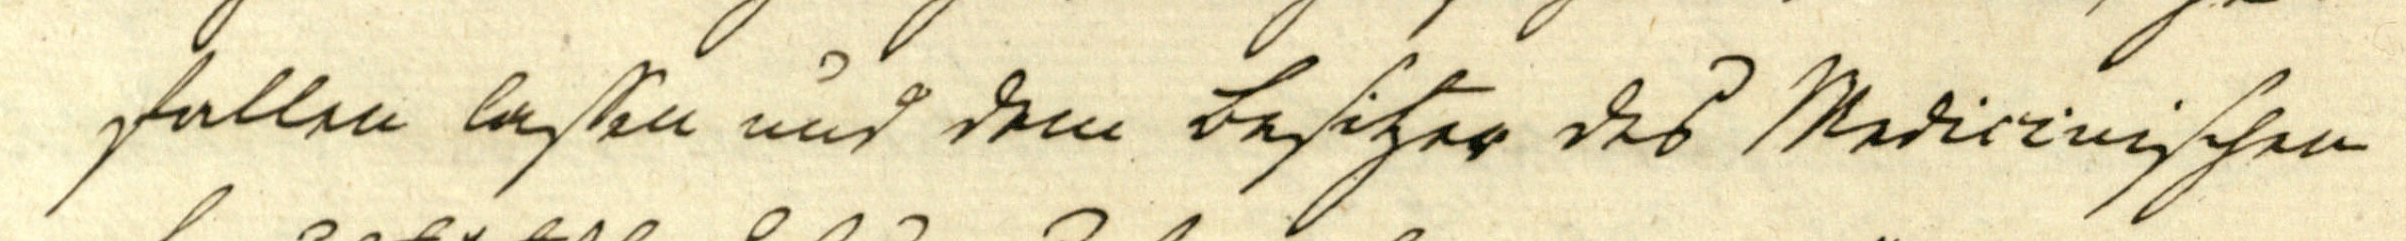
fallen lassen und dem Besitzer des Medicinischen
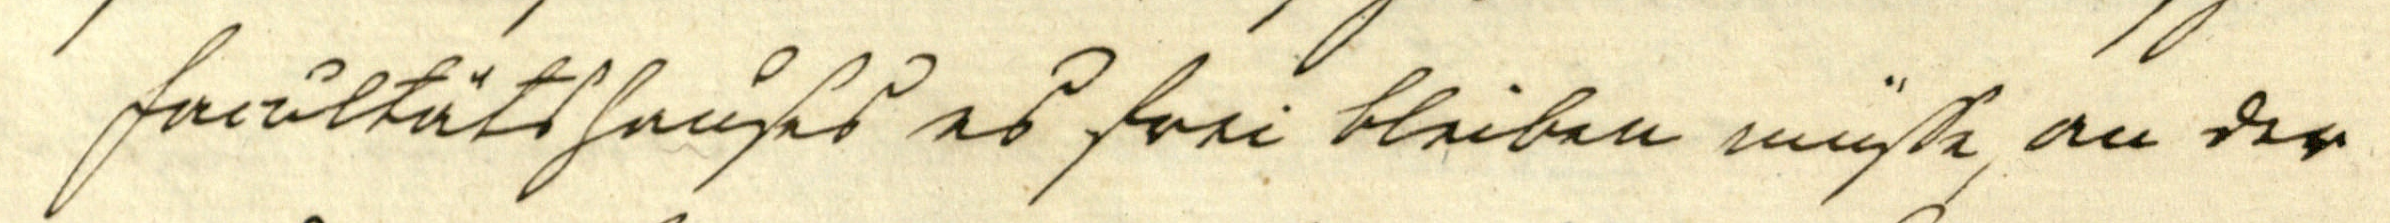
facultätshauses es frei bleiben müsse, an der
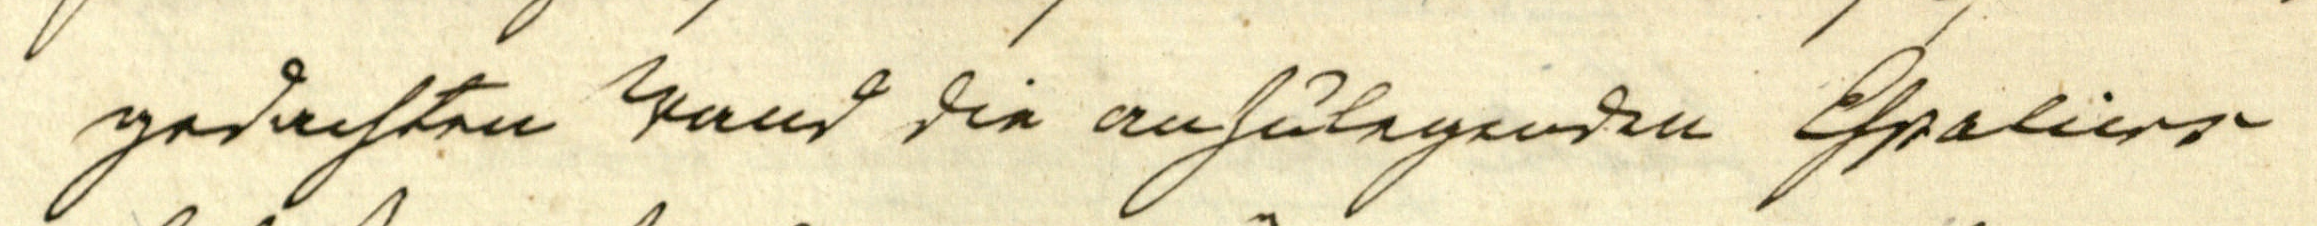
gedachten Wand die anzulegenden Espaliers
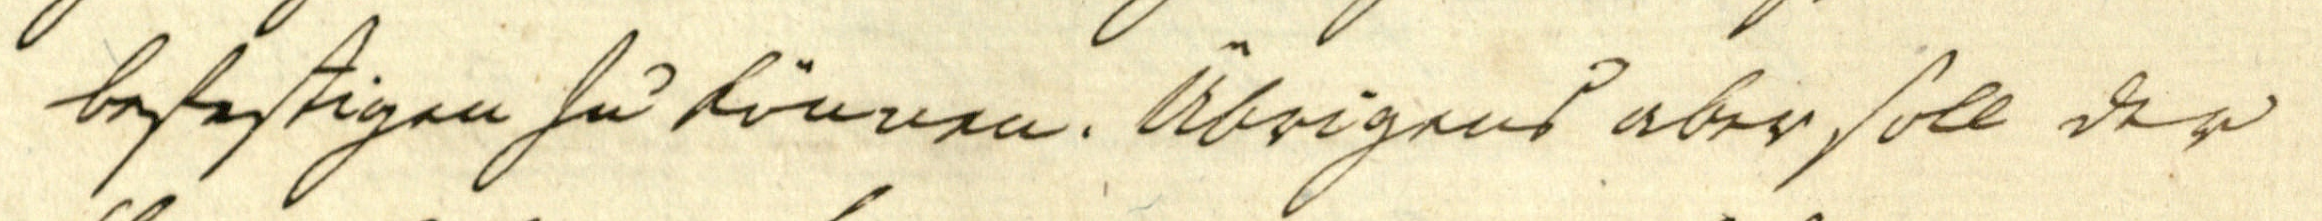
befestigen zu können. Übrigens aber soll der
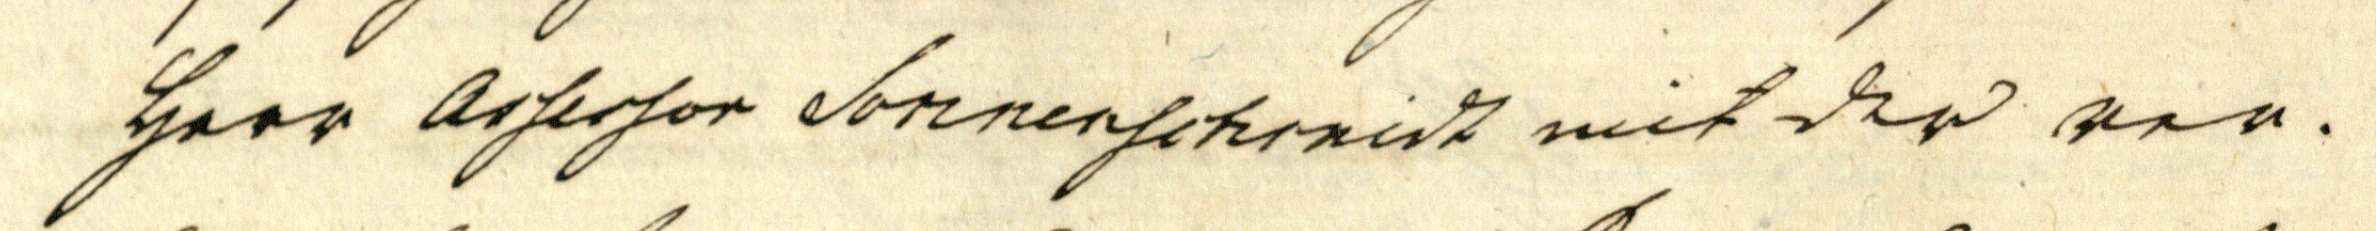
Herr Assessor Sonnenschmidt mit der ver¬
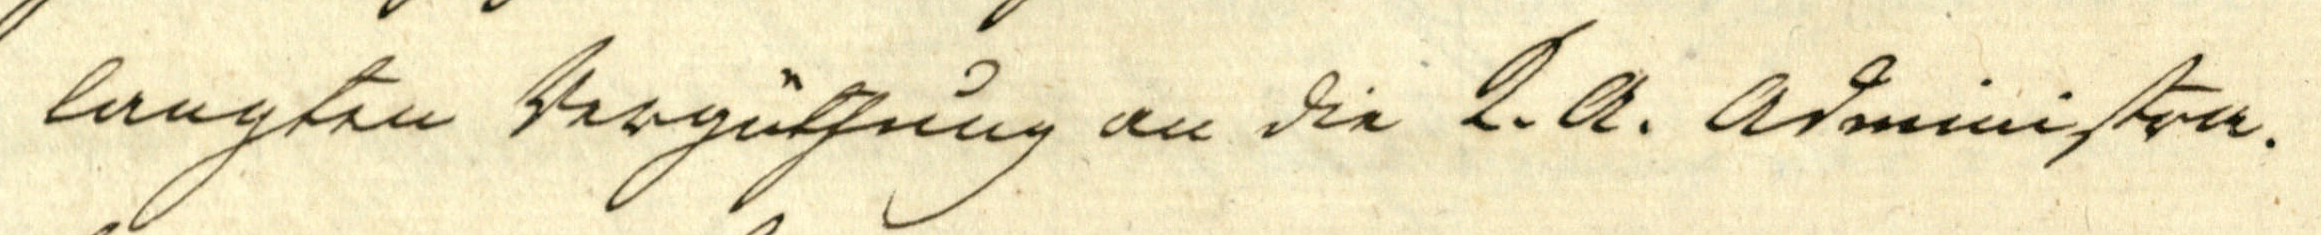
langten Vergüthung an die K. A. Administra¬
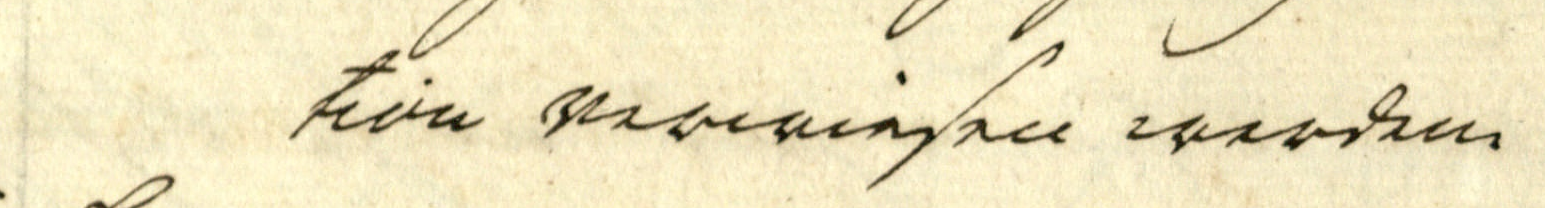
tion verwiesen werden.
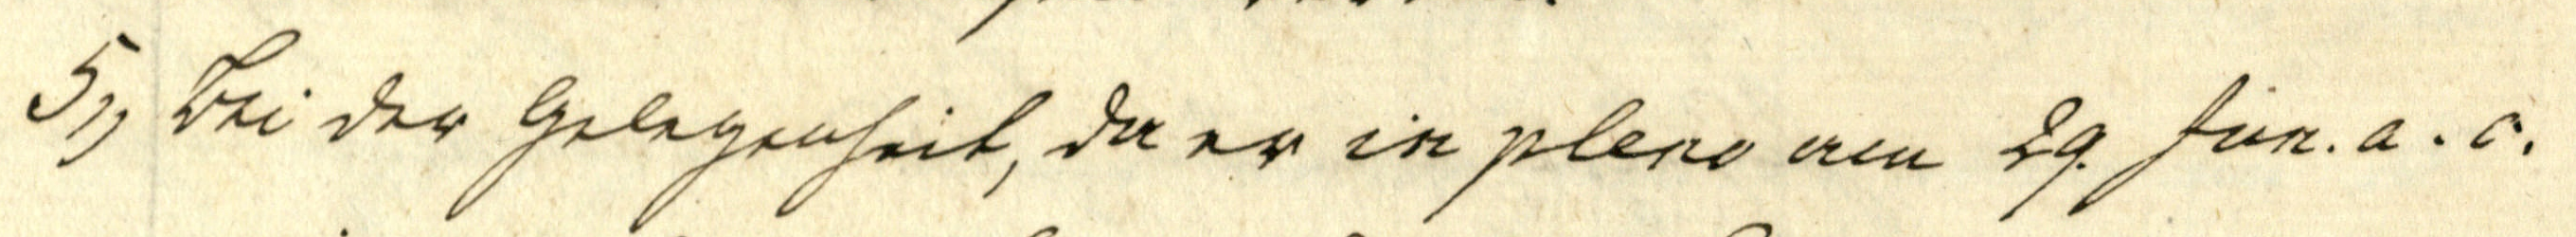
5, Bei der Gelegenheit, da er in pleno am 29. Jun. a. c.
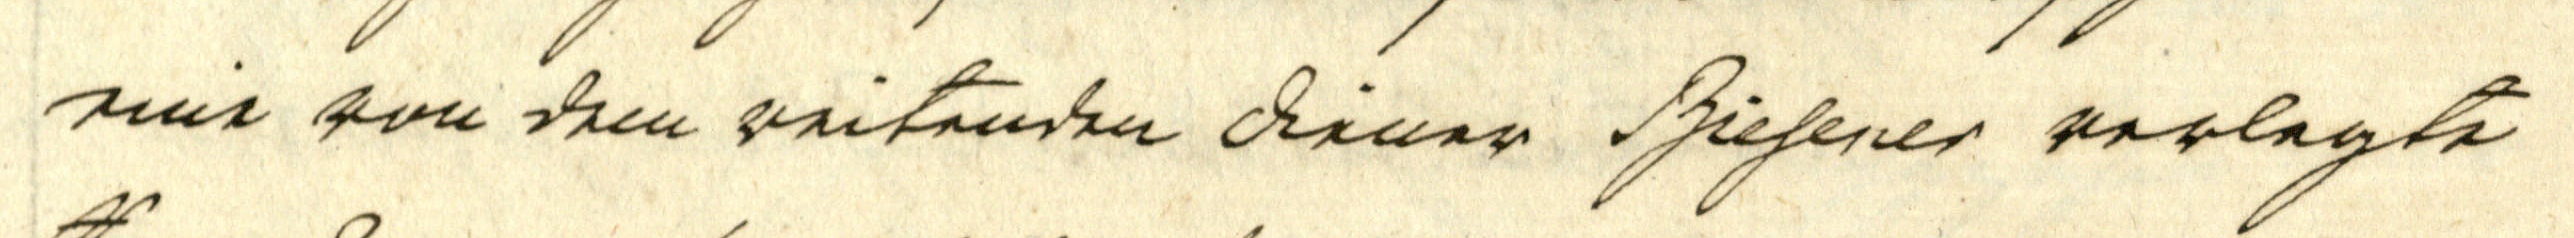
eine von dem reitenden Diener Biesener verlegte
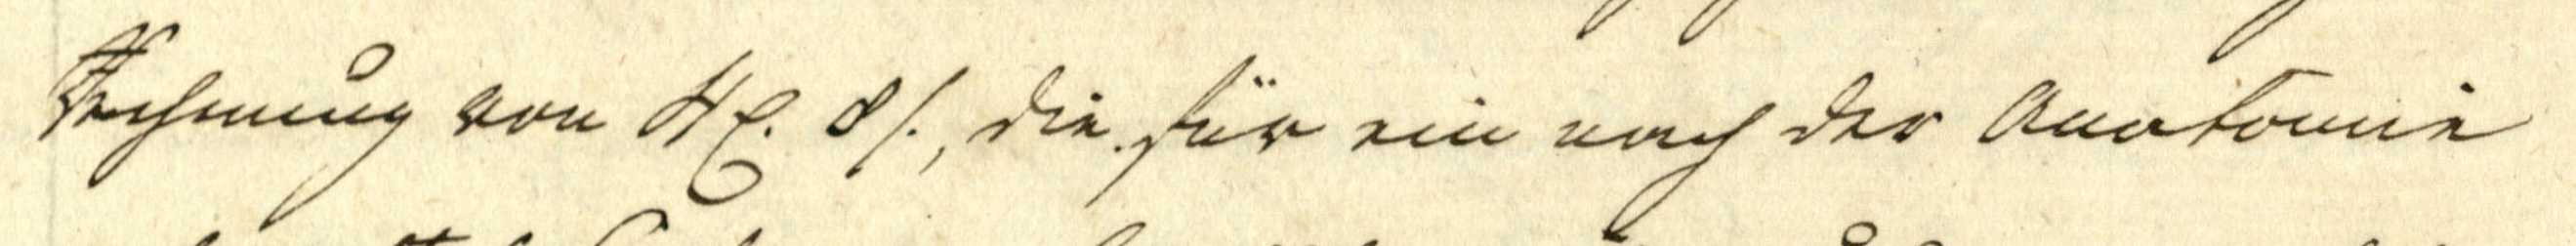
Rechnung von 4 l. 8 s., die für ein nach der Anatomie
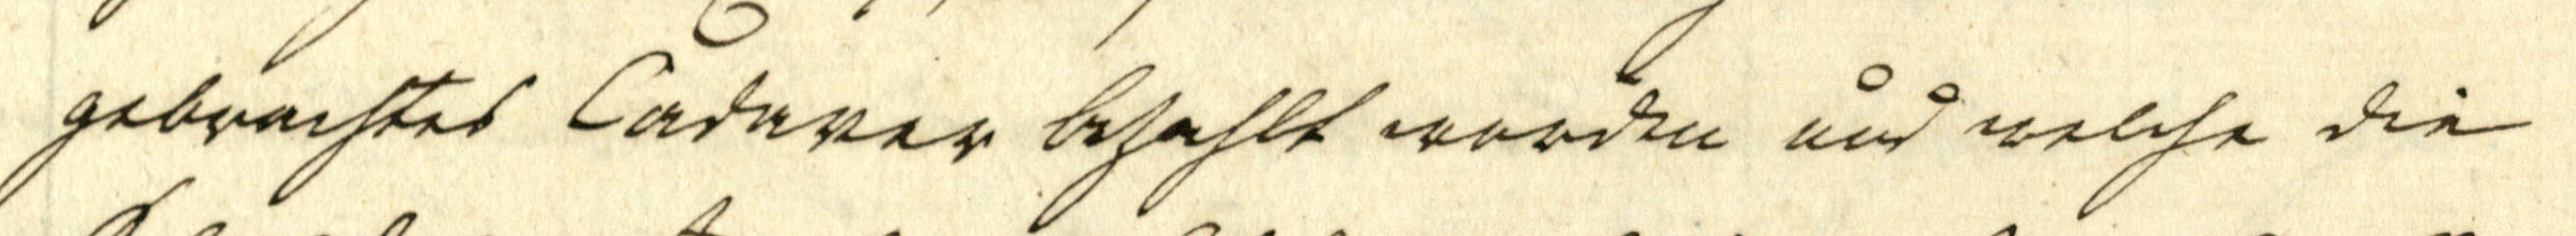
gebrachtes Cadaver bezahlt werden und welche die
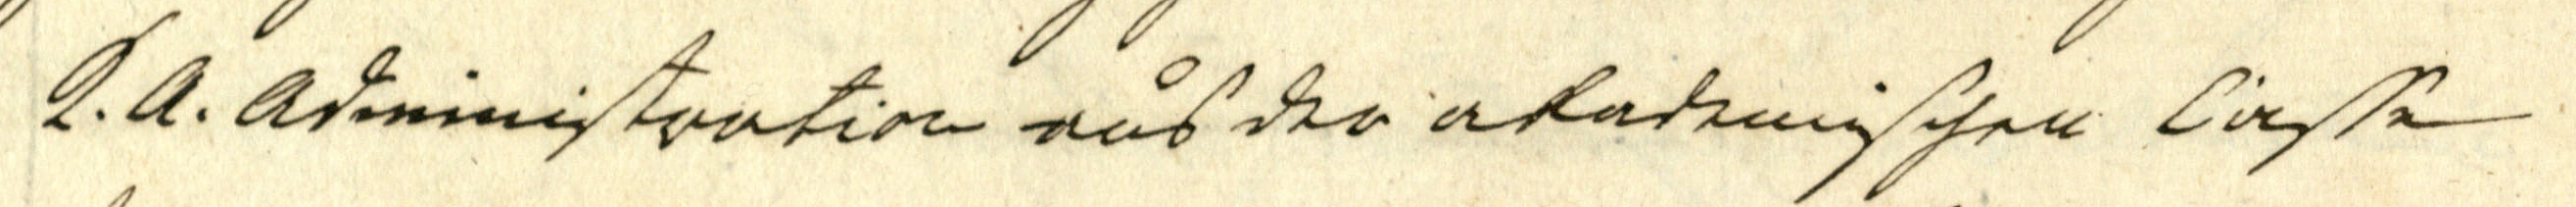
K. A. Administration aus der akademischen Casse
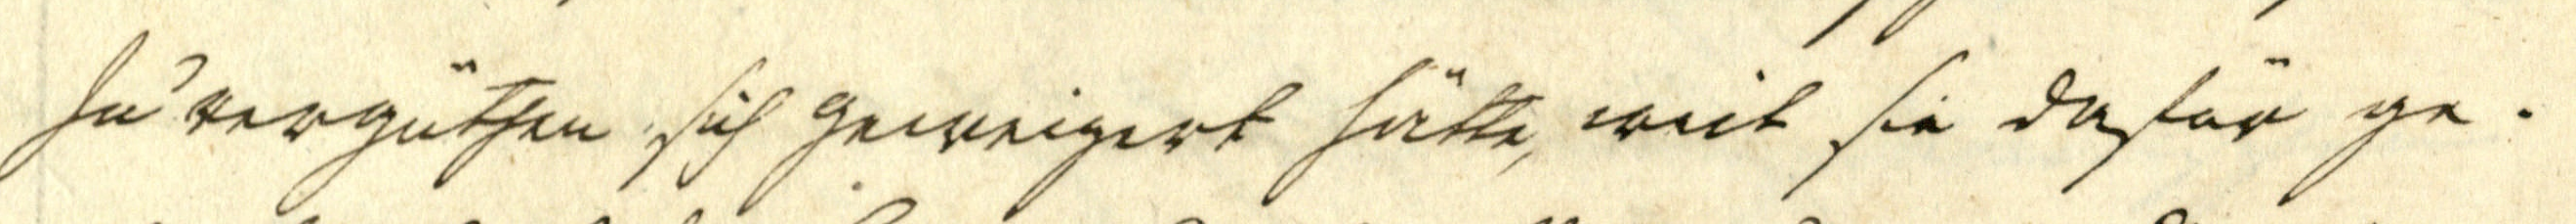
zu vergüthen sich geweigert hätte, weil sie dafür ge¬
